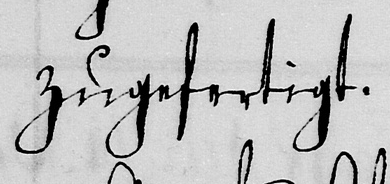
zugefertigt.
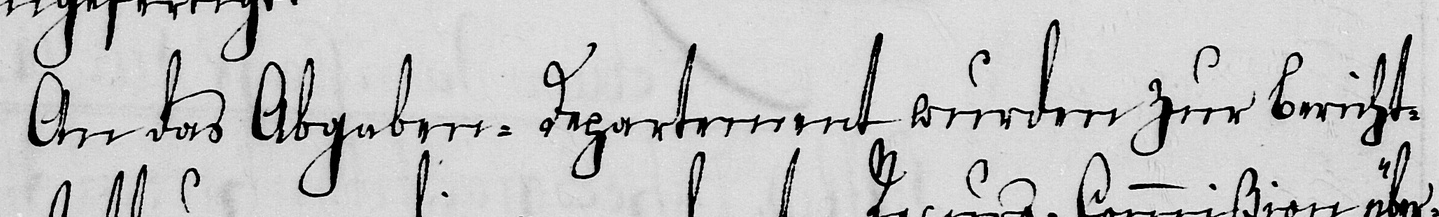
An das Abgaben-Departement wurden zur Bericht¬
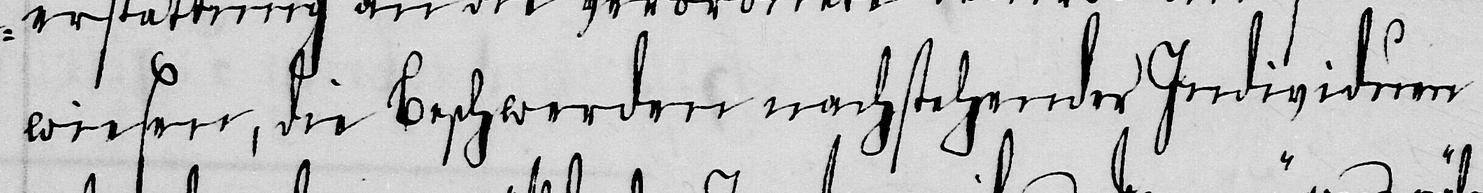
wiesen, die Beschwerden nachstehender Individuen
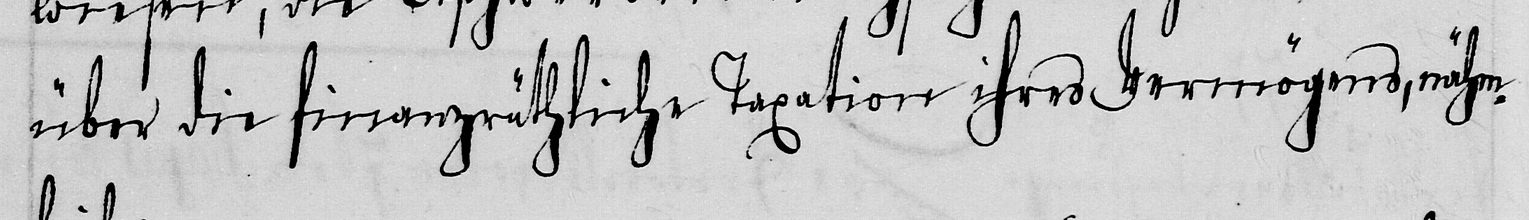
über die finanzräthliche Taxation ihres Vermögens, nähm¬
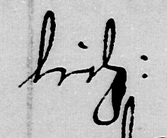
lich:
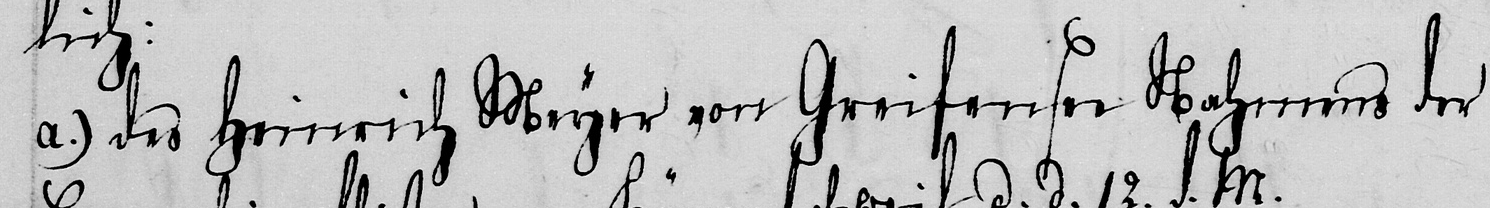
a.) des Heinrich Meyer von Greifensee Nahmens der
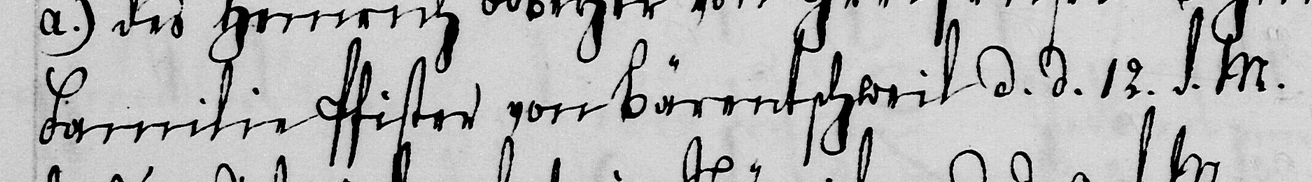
Familie Pfister von Bärentschweil d. d. 12. d. M.
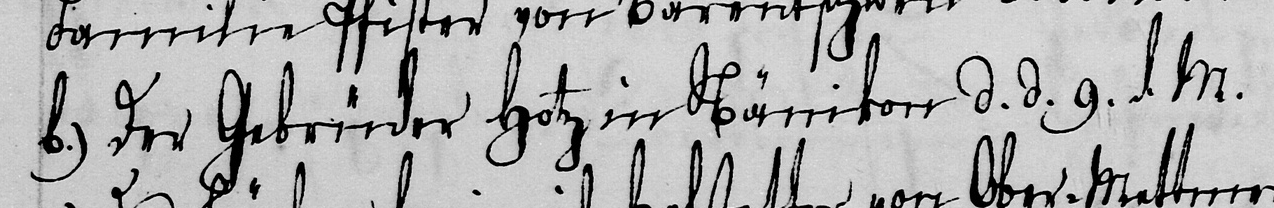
b.) Der Gebrüder Hotz in Nänikon d. d. 9. d. M.
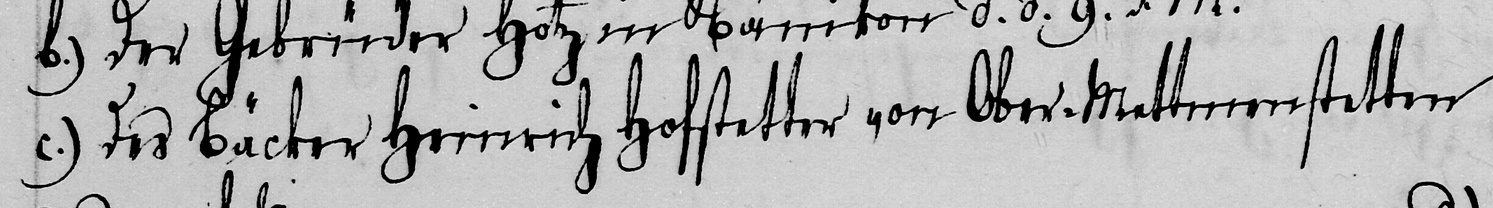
c.) Des Bäcker Heinrich Hofstetter von Ober-Mettmenstetten
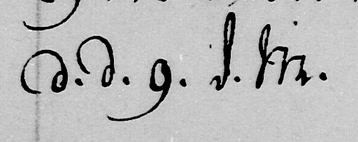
d. d. 9. d. M.
